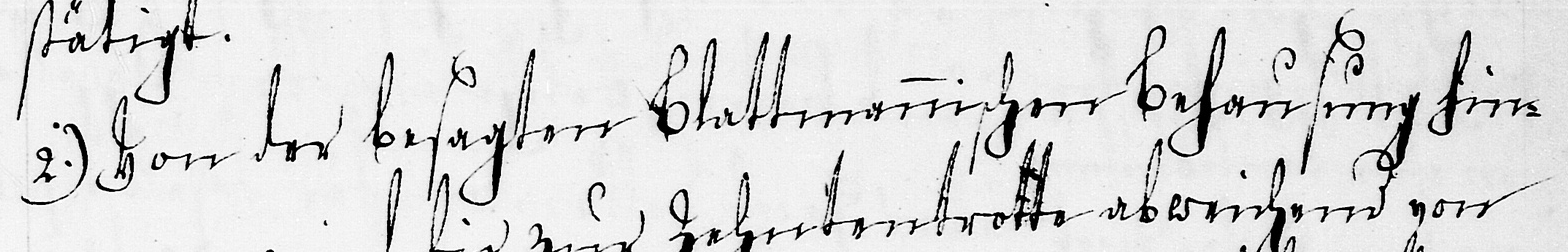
2.) Von der besagten Blattmannischen Behausung hin¬
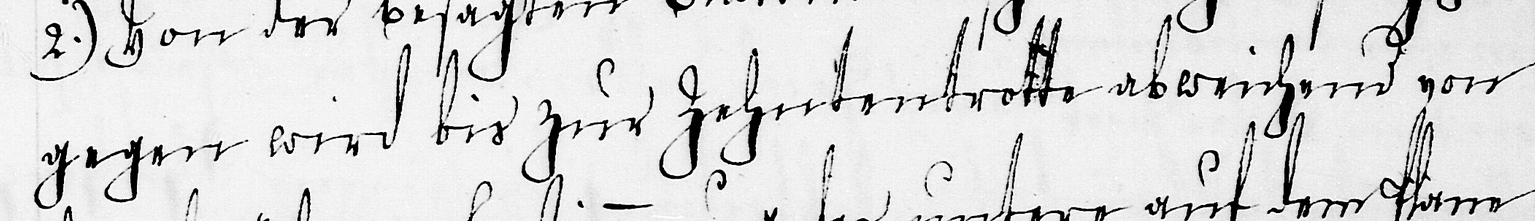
gegen wird bis zur Zehntentrotte abweichend von
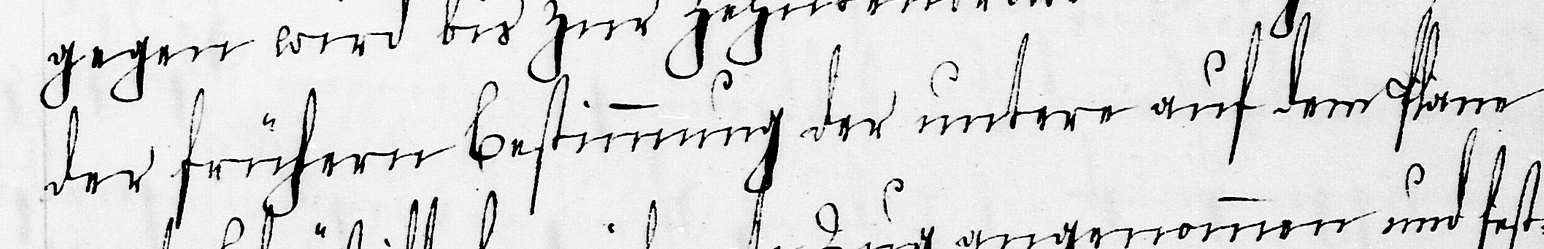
der frühern Bestimmung der untere auf dem Plane
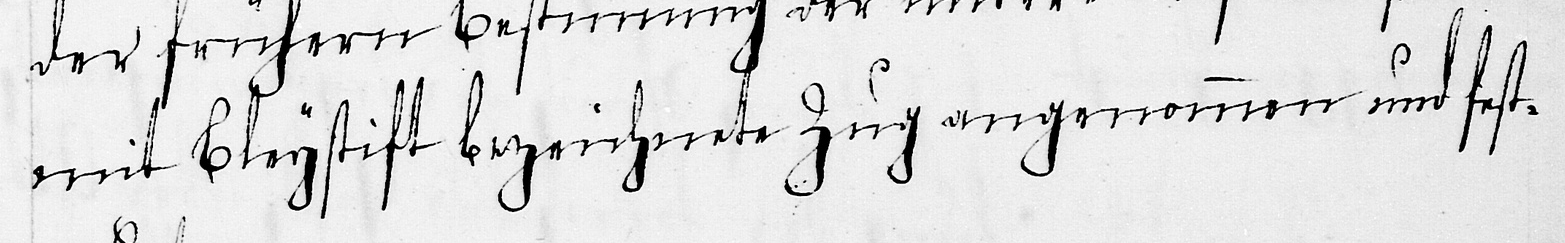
mit Bleystift bezeichnete Zug angenommen und fest¬
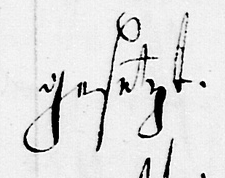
gesetz¬
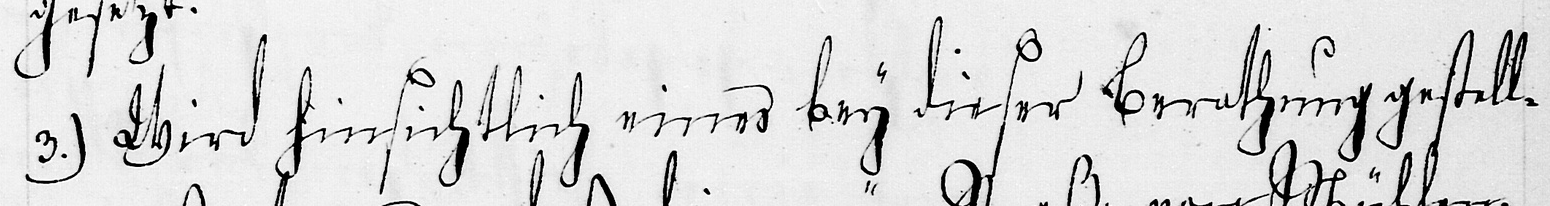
3.) Wird hinsichtlich eines bey dieser Berathung gestel¬
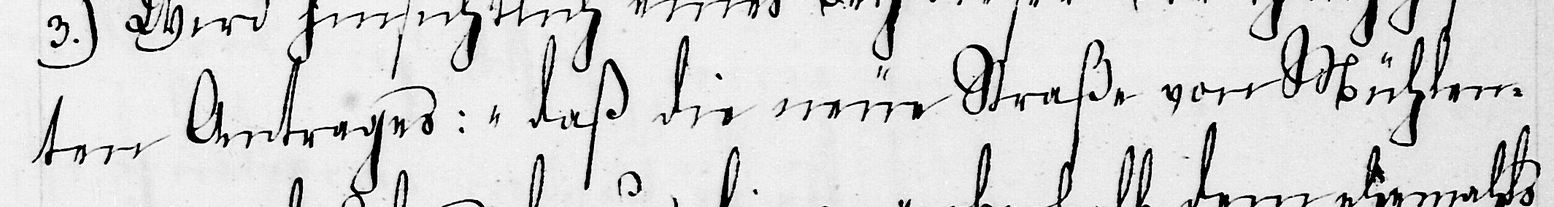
lten Antrages: „daß die neue Straße von Mühlen¬
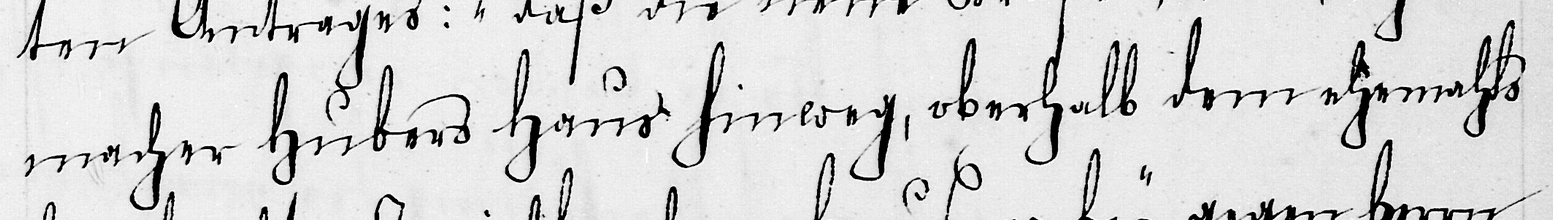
macher Hubers Haus hinweg, oberhalb dem ehemahls
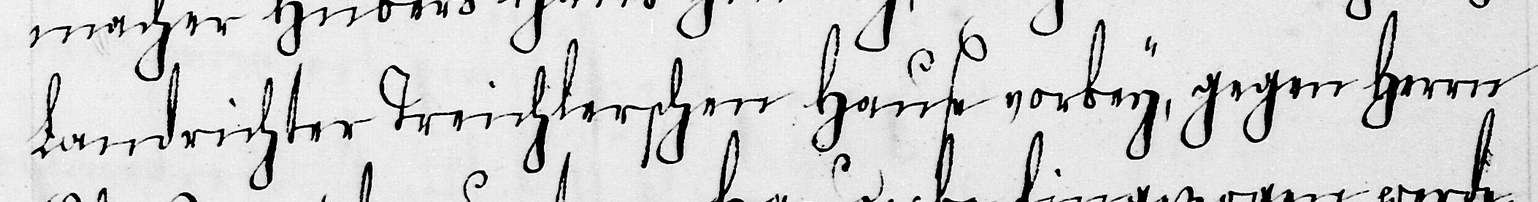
Landrichter Treichlerschen Hause vorbey, gegen Herrn
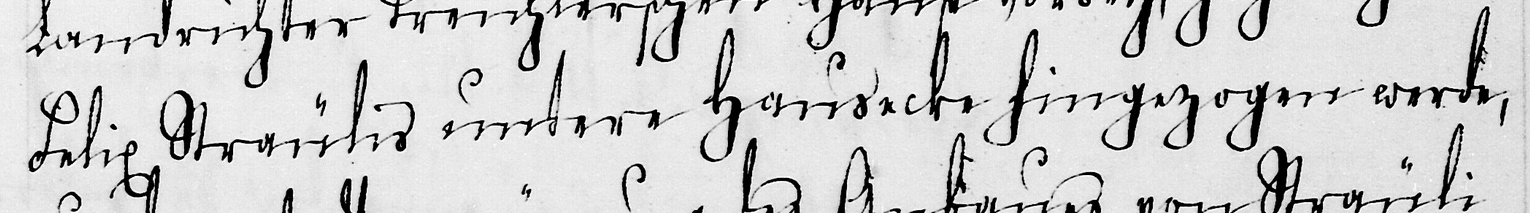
Felix Sträulis untere Hausecke hingezogen werde,
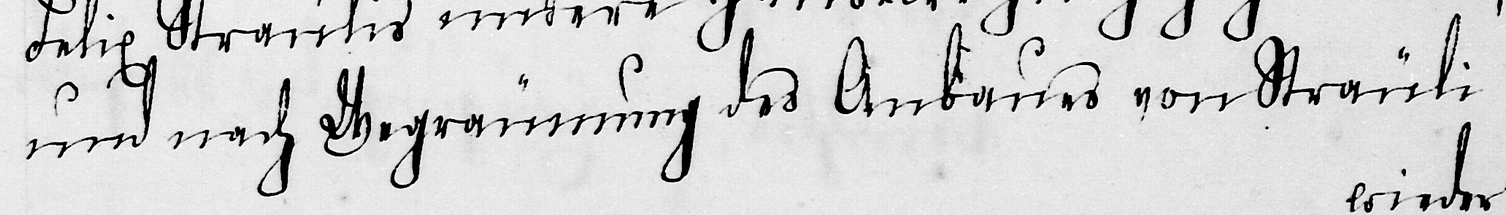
und nach Wegräumung des Anbaues von Sträuli
